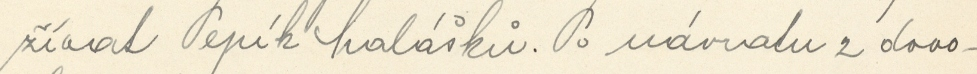žívat Pepík Malášků. Po návratu z dovo-
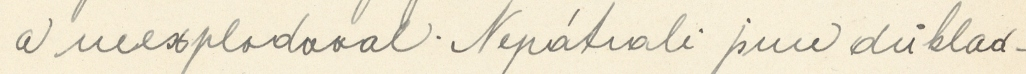a neexplodoval. Nepátrali jsme důklad-
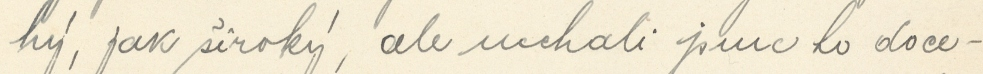hý, jak široký, ale nechali jsme ho doce-
